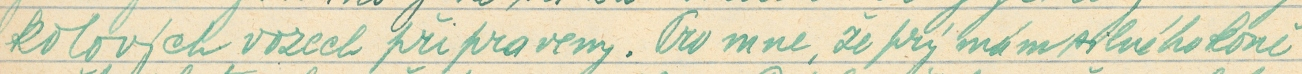kolových vozech připraveny. Pro mne, že prý mám silného koně
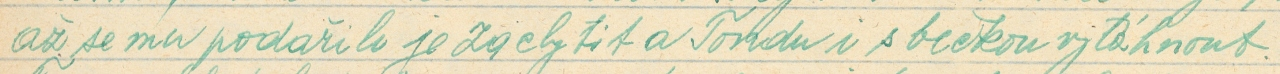až se mu podařilo je zachytit a Tondu i s bečkou vytáhnout.
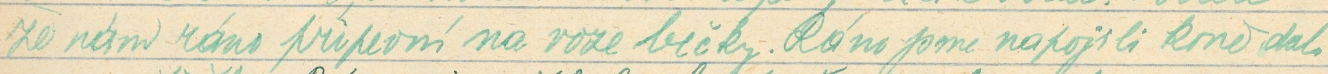že nám ráno připevní na voze bečky. Ráno jsme napojili koně dali
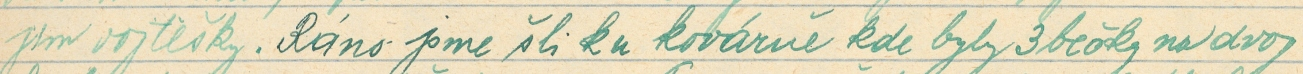jim vojtěšky. Ráno jsme šli ku kovárně kde byly 3 bečky na dvoj
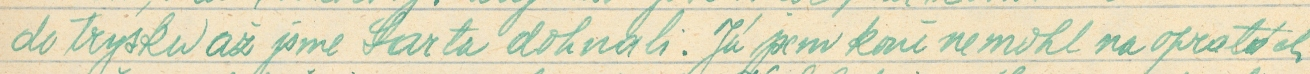do trysku až jsme Sarta dohnali. Já jsem koně nemohl na opratích
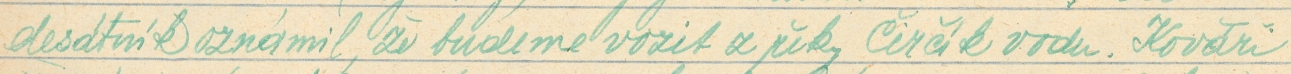desátník oznámil, že budeme vozit z řeky Čirčík vodu. Kováři
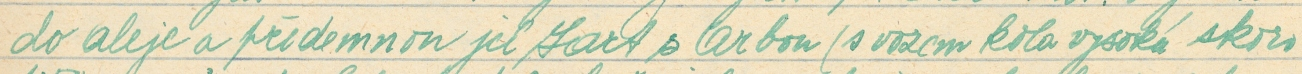do aleje a přede mnou jel Sart s Arbou (s vozem kola vysoká skoro
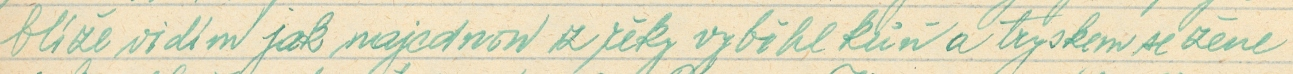blíže vidím jak najednou z řeky vyběhl kůň a tryskem se žene
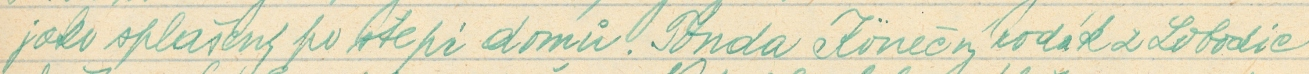jako splašený po stepi domů. Tonda Konečný rodák z Lobodic
